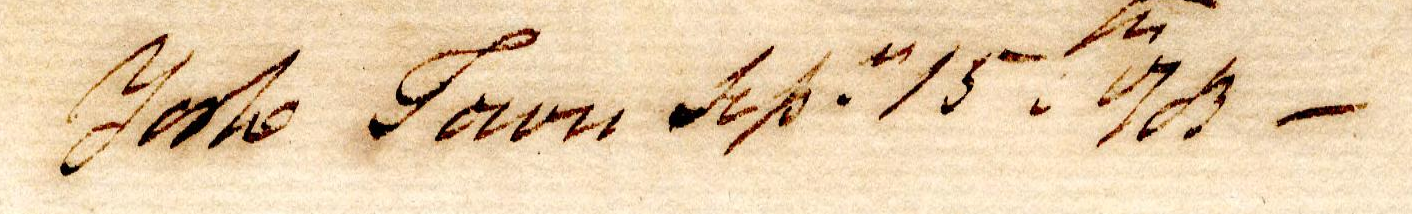Yorke Town Sep^r. 15^th. 1783
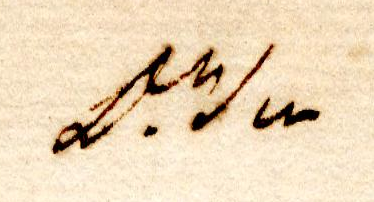D^r. Sir
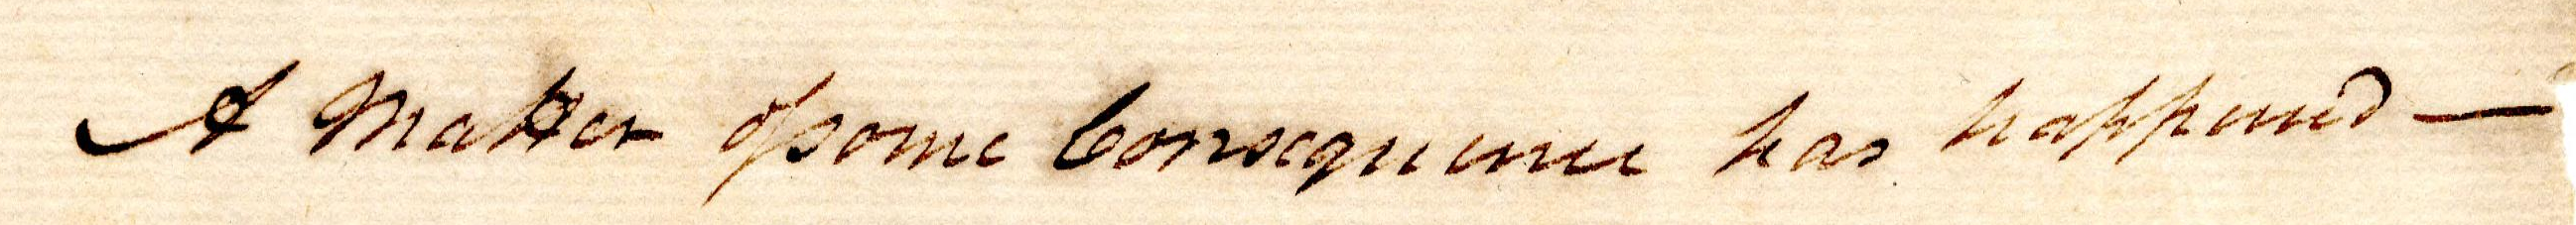A Matter of some Consequence has happened
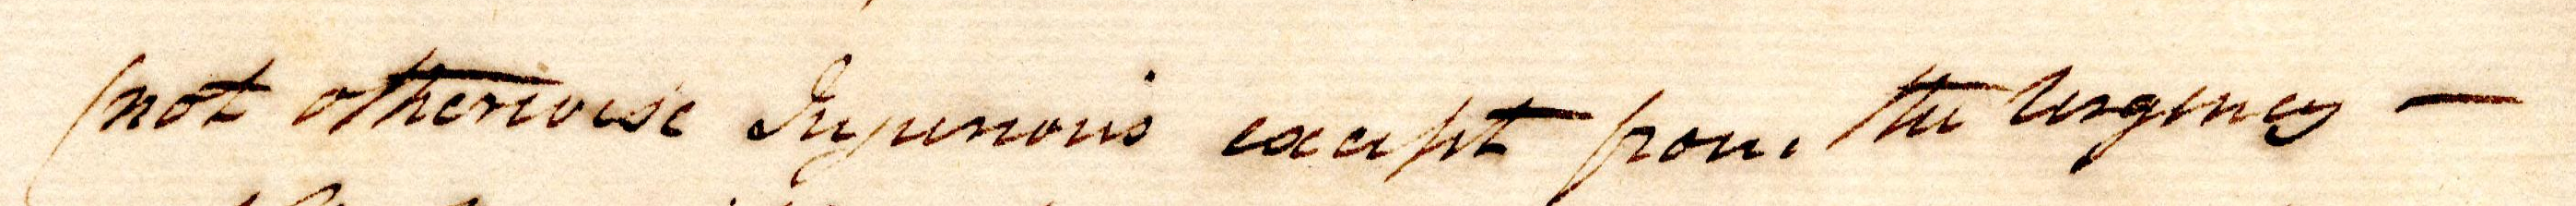(not otherwise Injurious except from the Urgency
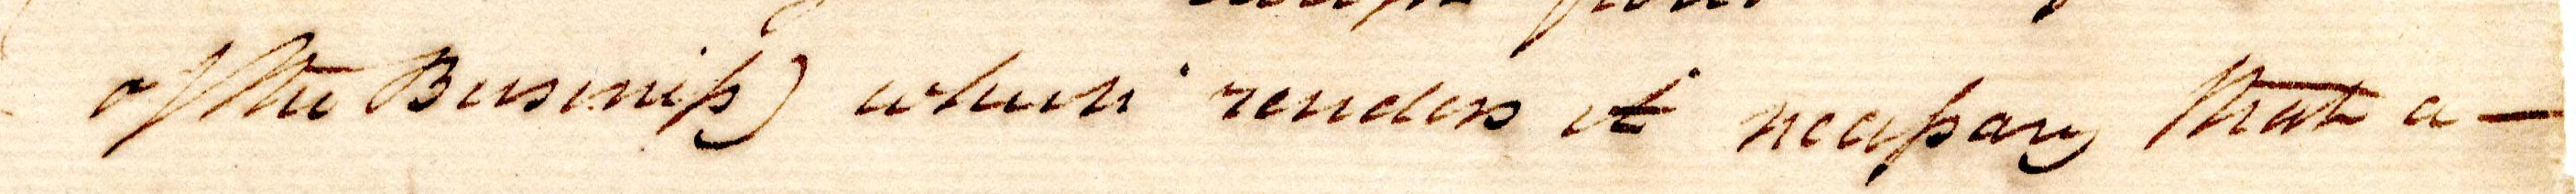of the Business) which renders it necessary that a
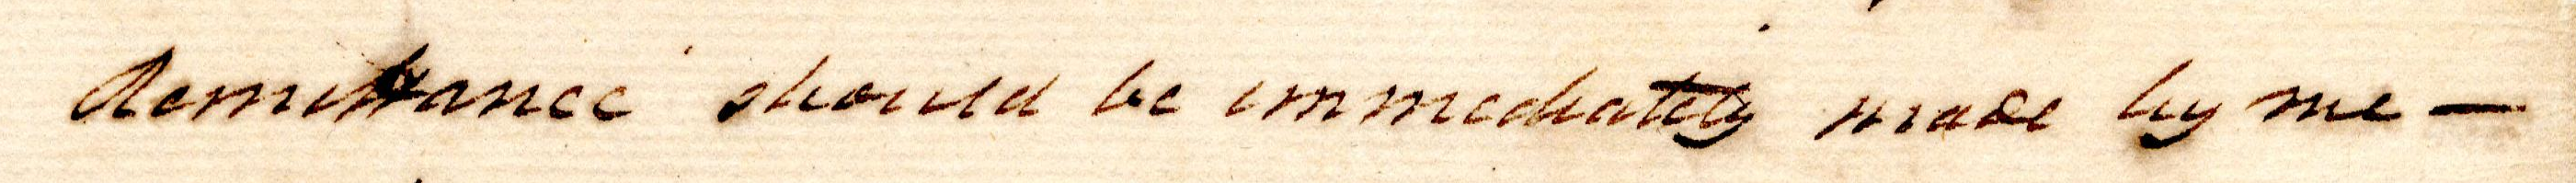Remittance should be immediately made by me
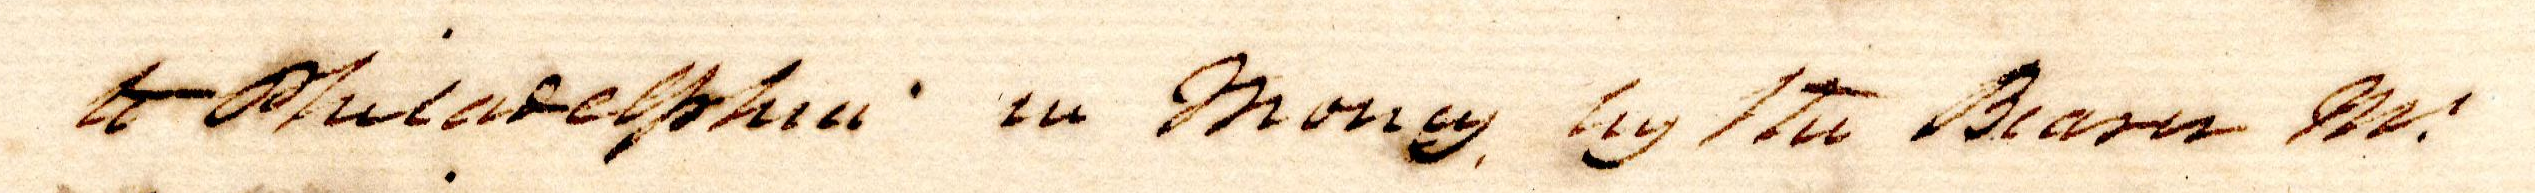to Philadelphia in Money by the Bearer M^r.
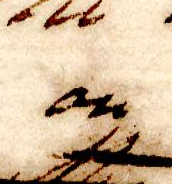on
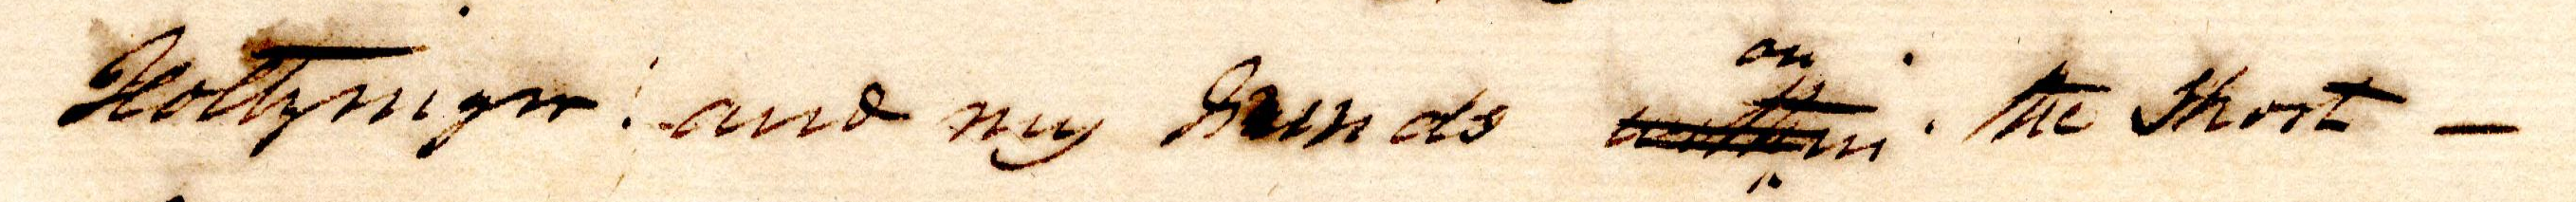Hollzniger; and my Friends [within] the short
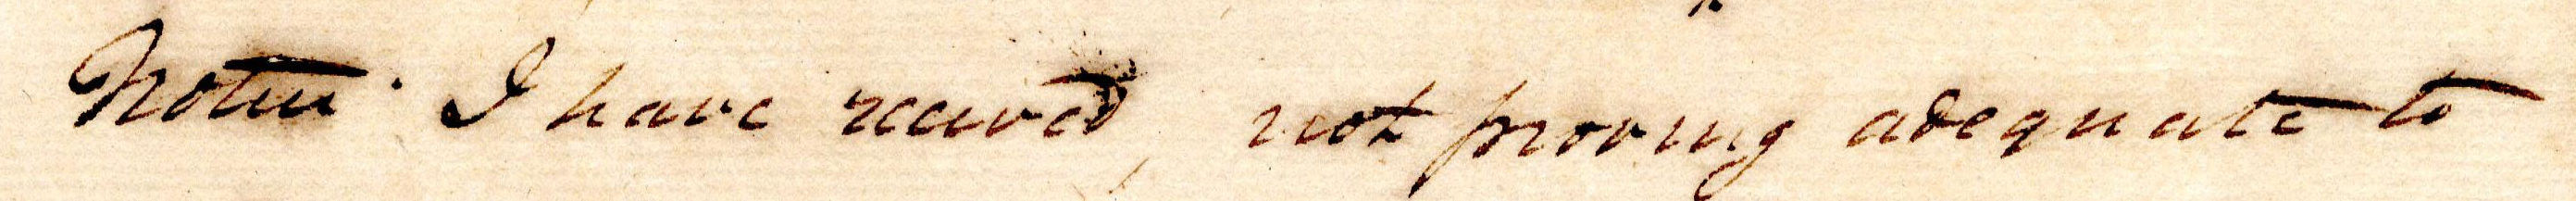notice I have received not proving adequate to
